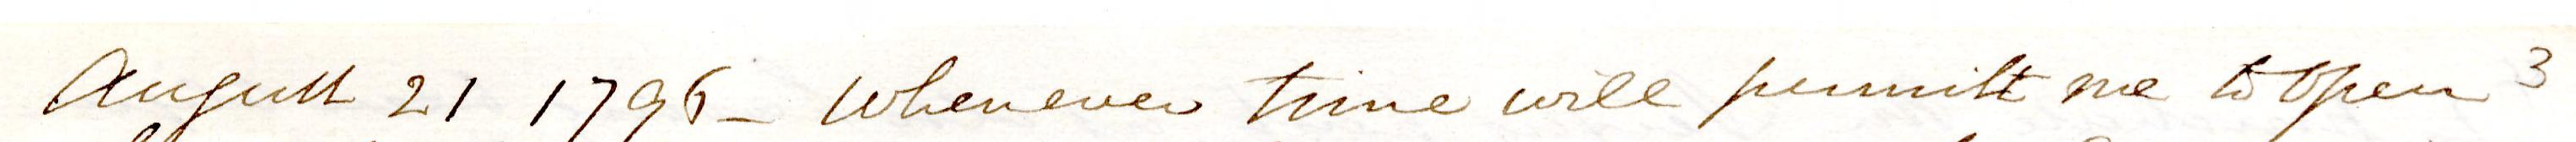August 21 1796.- whenever time will permitt me to open 3
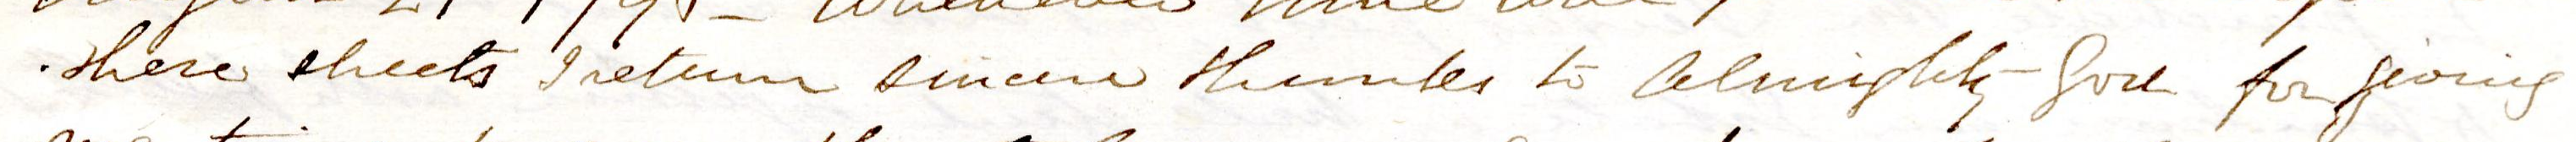there sheets I return sincere thanks to almighty God for giving
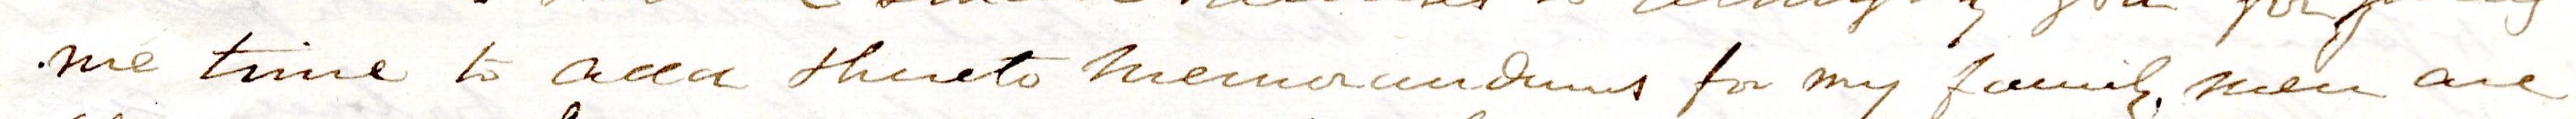me time to add thereto recommondations for my family, near are
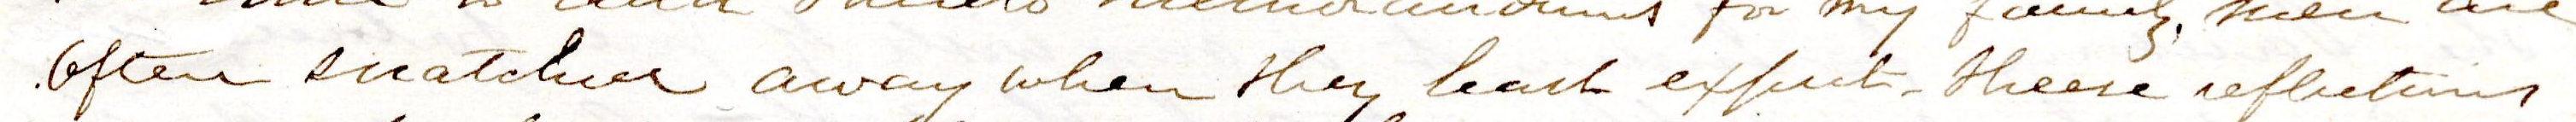often snatched away when they least expect- these reflections
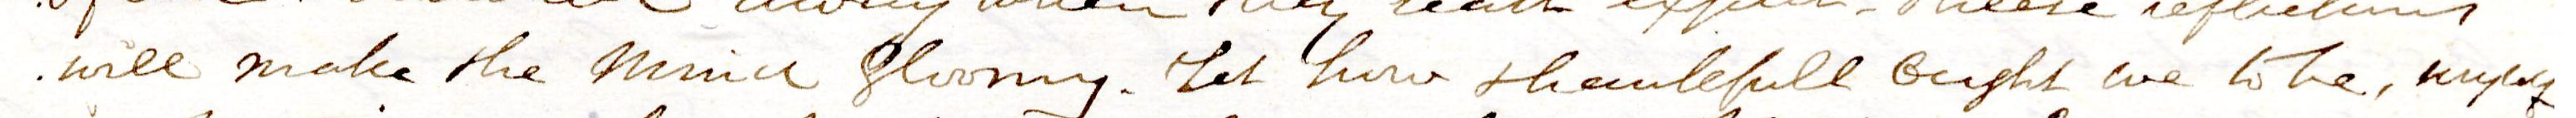will make the mimic gloomy. Let how thankfull ought we to be, maybe
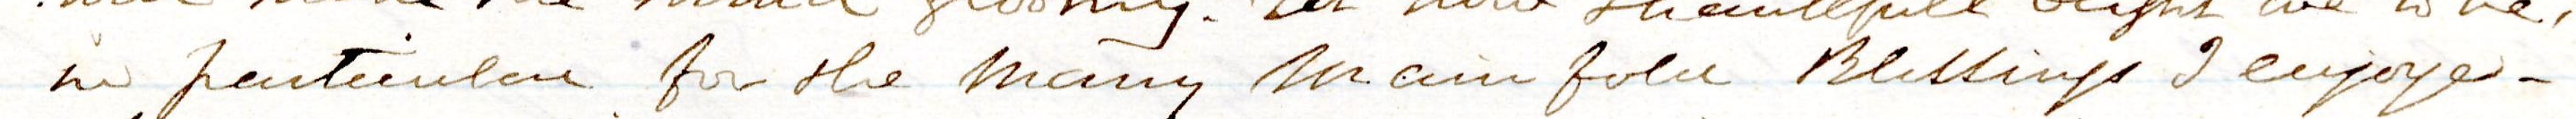in particular for the many manifold Blessings I enjoye-
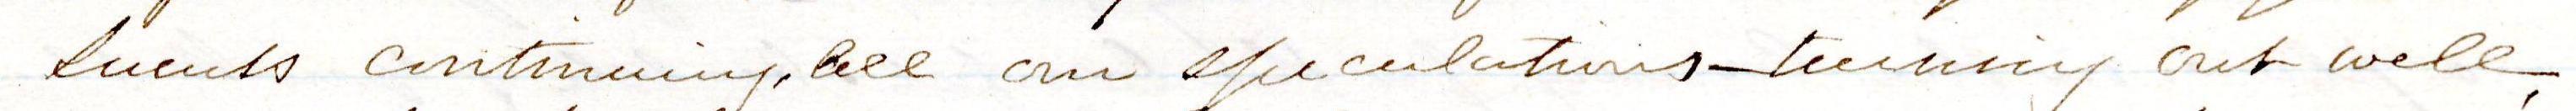Secrets Continuing, all are speculations.- turning out well,
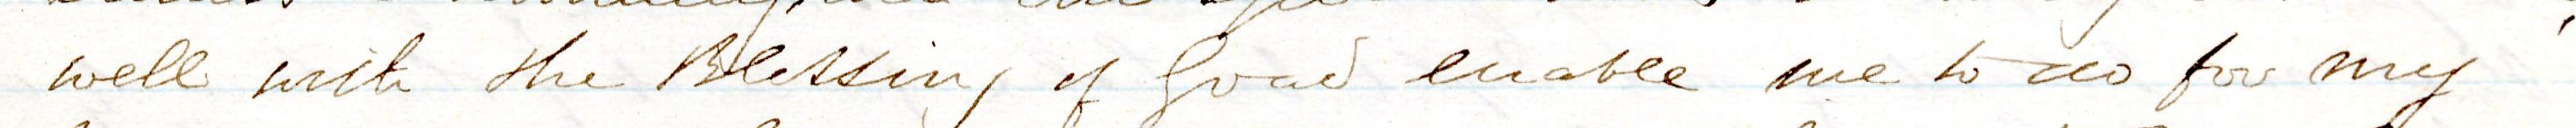well with the Blessing of Good enable me to do for my
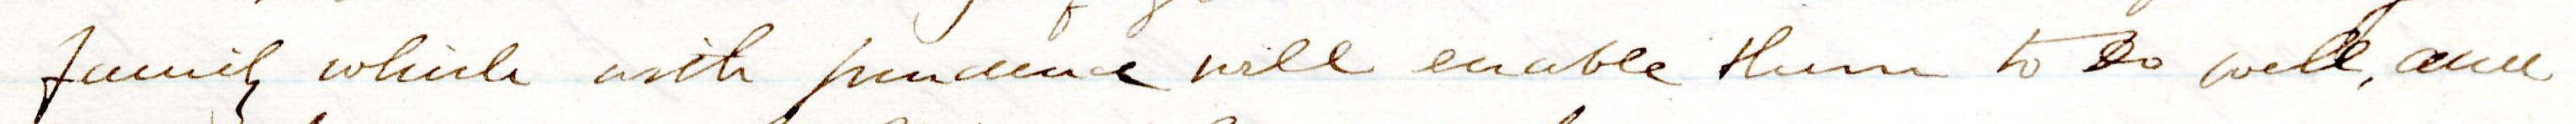family which with prudence will enable then to do well, and
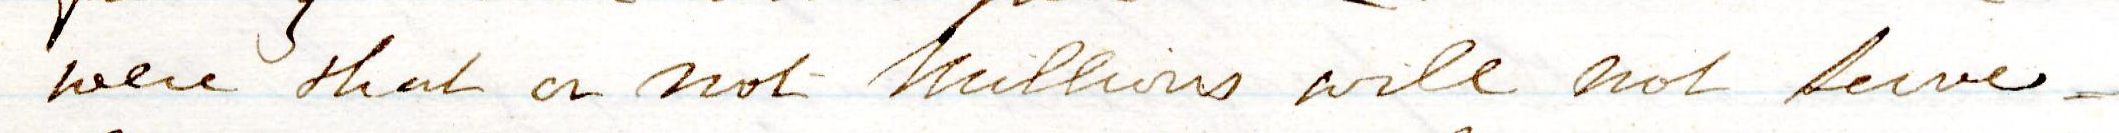were that or not Williams will not leave.-
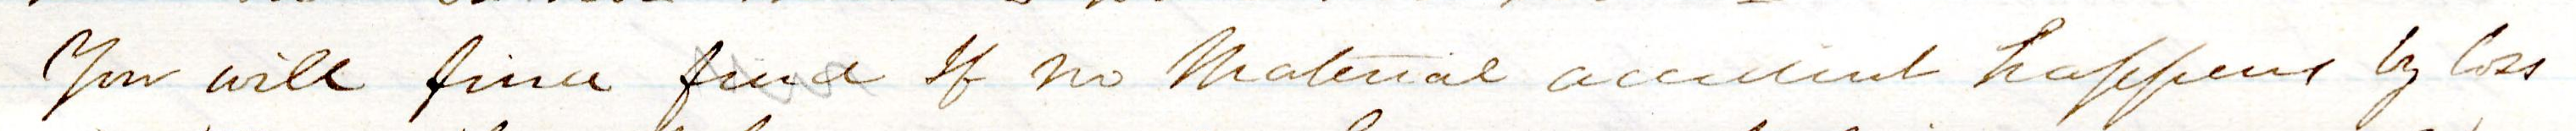You will find find If no material account happens by Cox
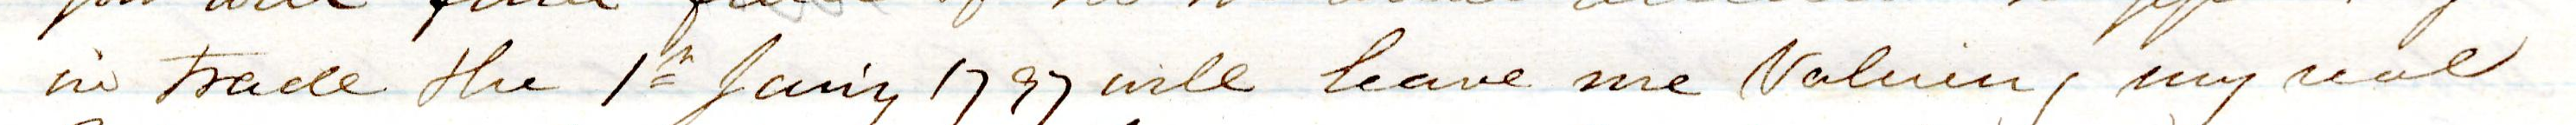in trade the 1^t Jan'y 1797 will leave me Value in, my real
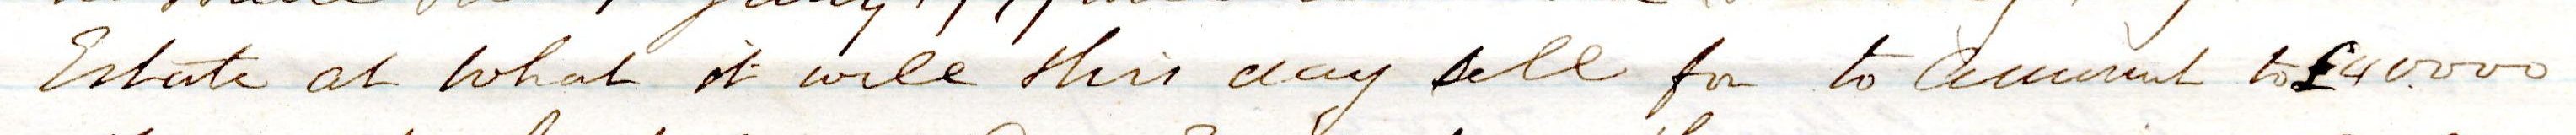Estate at what it will this day all for to Amount to £40,000
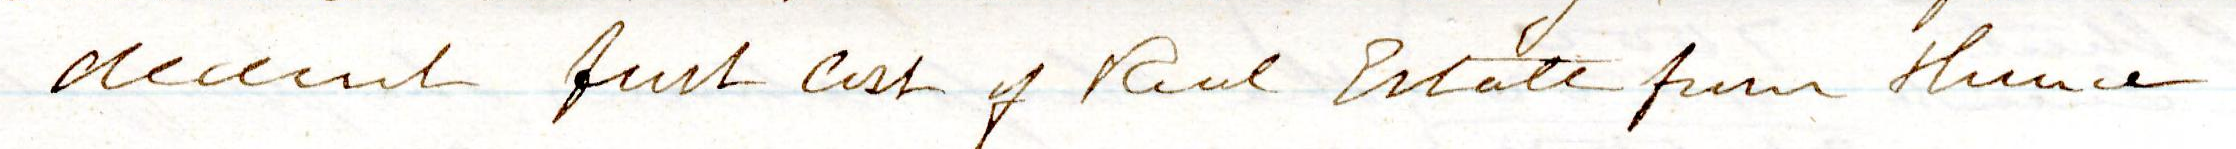account just cost of Real Estate from thence
